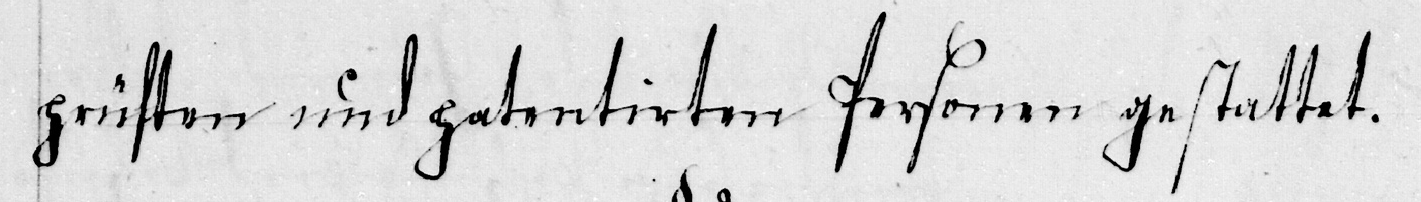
prüften und patentirten Personen gestattet.
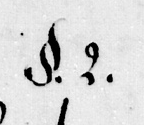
§. 2.
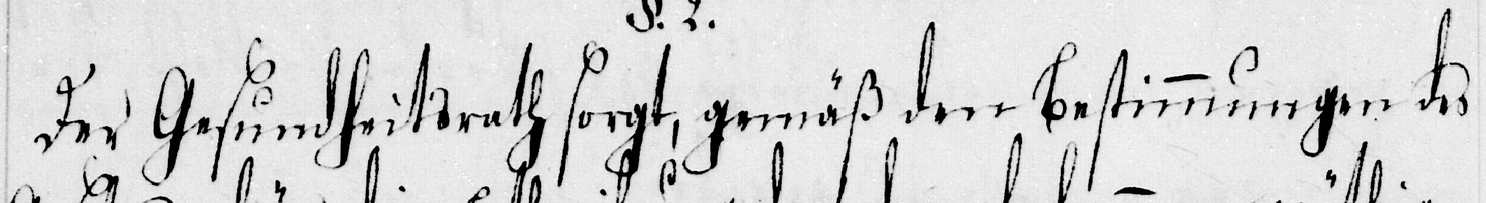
Der Gesundheitsrath sorgt, gemäß den Bestimmungen des
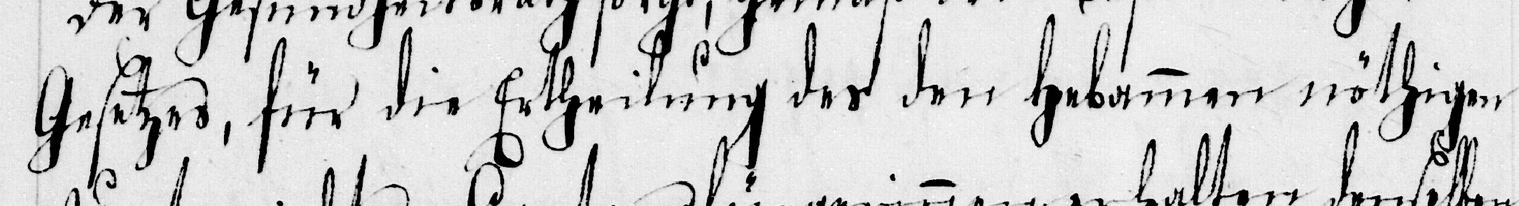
Gesetzes, für die Ertheilung des den Hebammen nöthigen
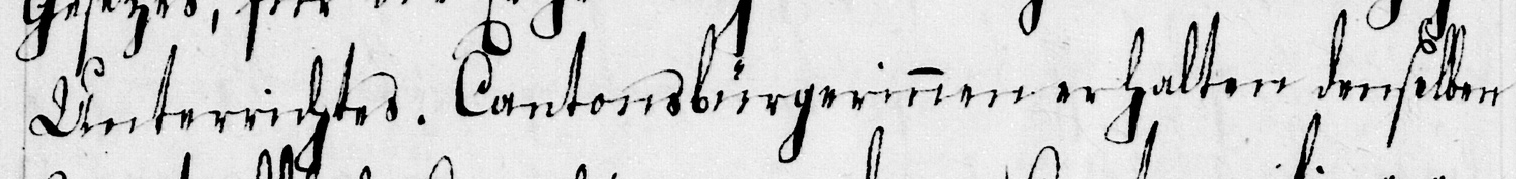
Unterrichtes. Cantonsbürgerinnen erhalten denselben
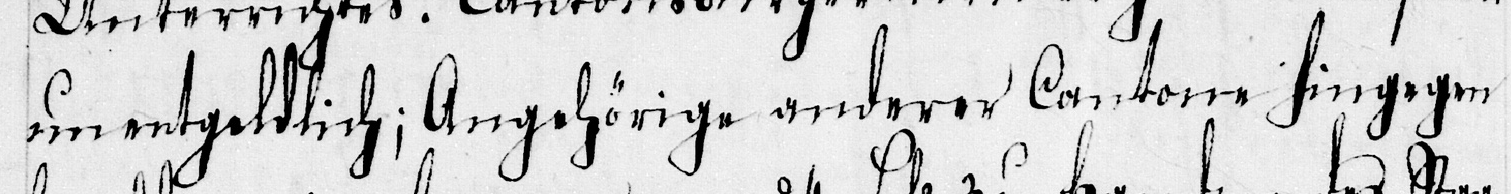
unentgeldlich; Angehörige anderer Cantone hingegen
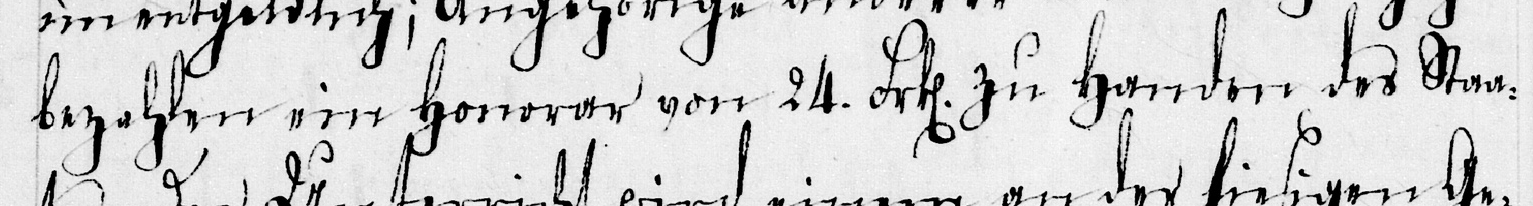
bezahlen ein Honorar von 24. Frk[en]. zu Handen des Staa¬
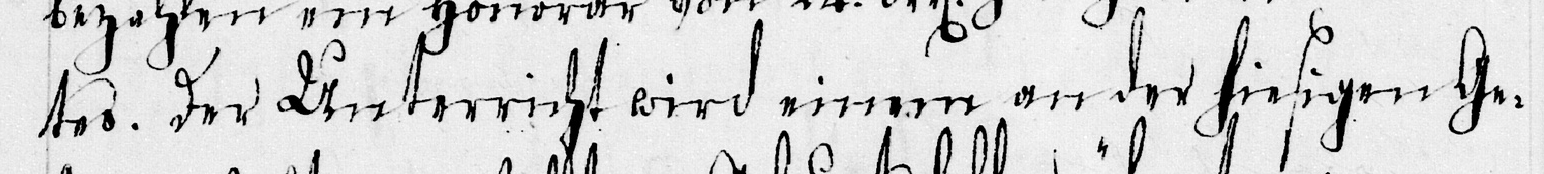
tes. Der Unterricht wird einem an der hiesigen Ge¬
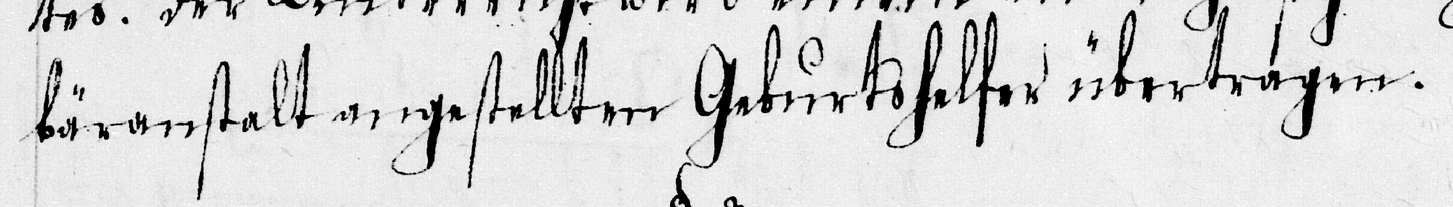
bäranstalt angestellten Geburtshelfer übertragen.
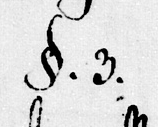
§. 3.
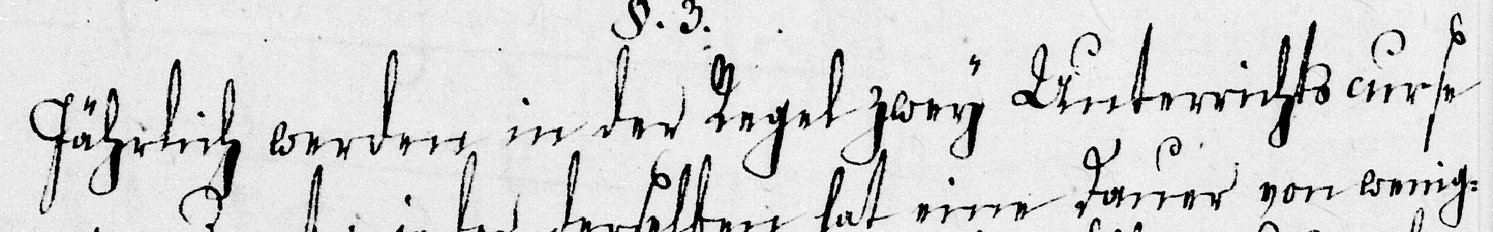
Jährlich werden in der Regel zwey Unterrichtscurse
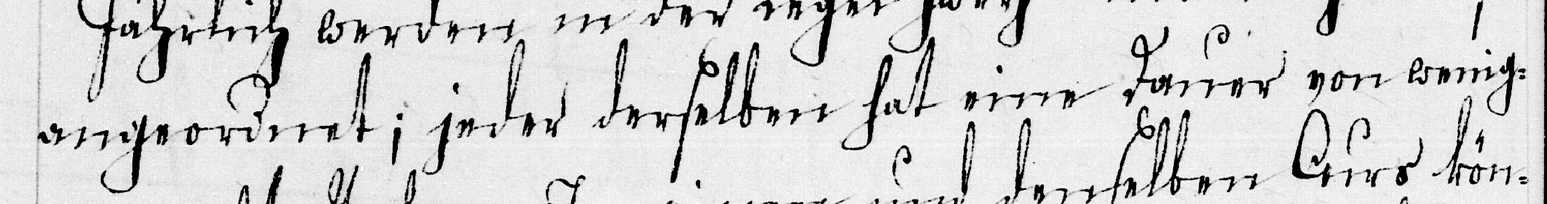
angeordnet; jeder derselben hat eine Dauer von wenig¬
